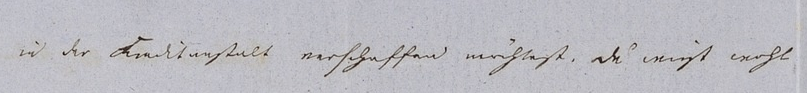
in der Kreditanstalt verschaffen möchtest. Du wirst wohl
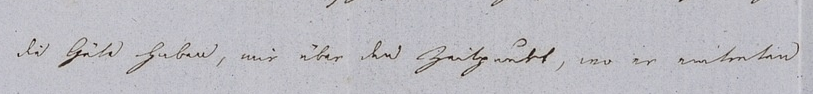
die Güte haben, mir über den Zeitpunkt, wo er eintreten
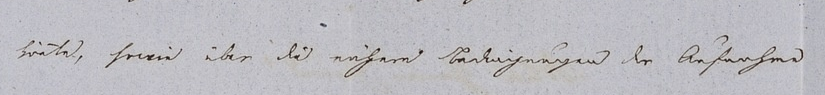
könnte, sowie über die nähern Bedingungen der Aufnahme
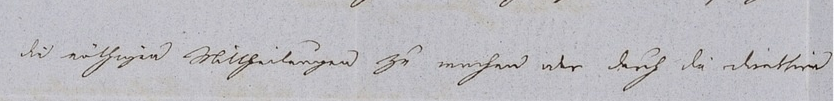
die nöthigen Mittheilungen zu machen oder durch die Direktion
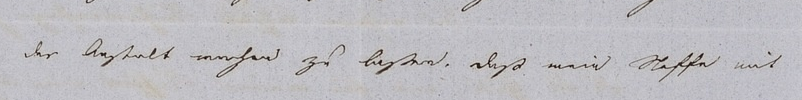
der Anstalt machen zu laßen. Daß mein Neffe mit
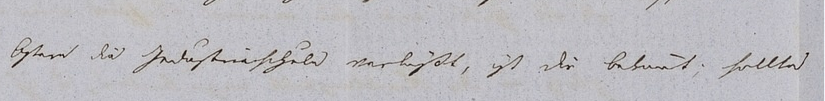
Ostern die Industrieschule verläßt, ist Dir bekannt; sollte
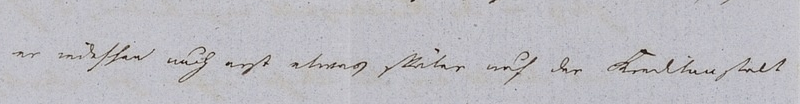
er indessen auch erst etwas später auf der Kreditanstalt
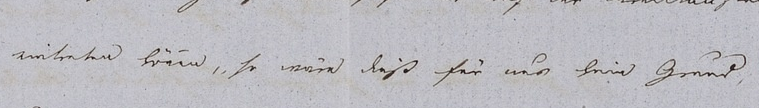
eintreten können, so wäre dieß für uns kein Grund,
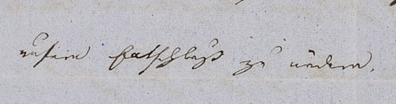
unsern Entschluß zu ändern.
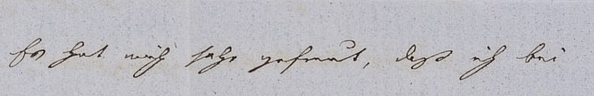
Es hat mich sehr gefreut, daß ich bei
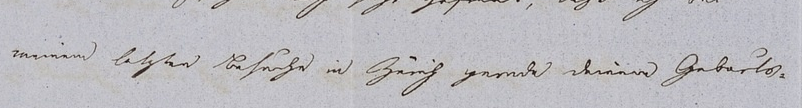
meinem letzten Besuche in Zürich gerade Deinem Geburts-
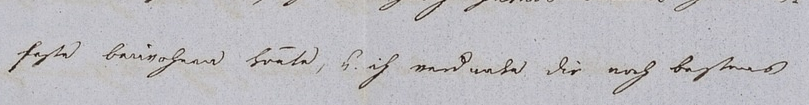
feste beiwohnen konnte, u. ich verdanke Dir noch bestens
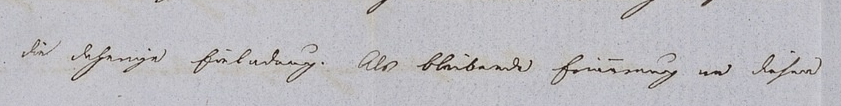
die daherige Einladung. Als bleibende Erinnerung an diesen
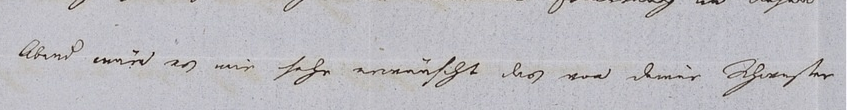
Abend wäre es mir sehr erwünscht das von Deiner Schwester
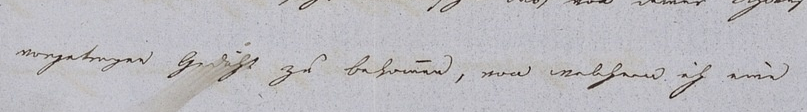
vorgetragne Gedicht zu bekommen, von welchem ich eine
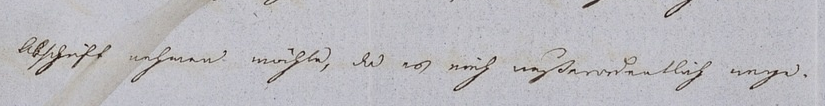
Abschrift nehmen möchte, da es mich außerordentlich ange-
